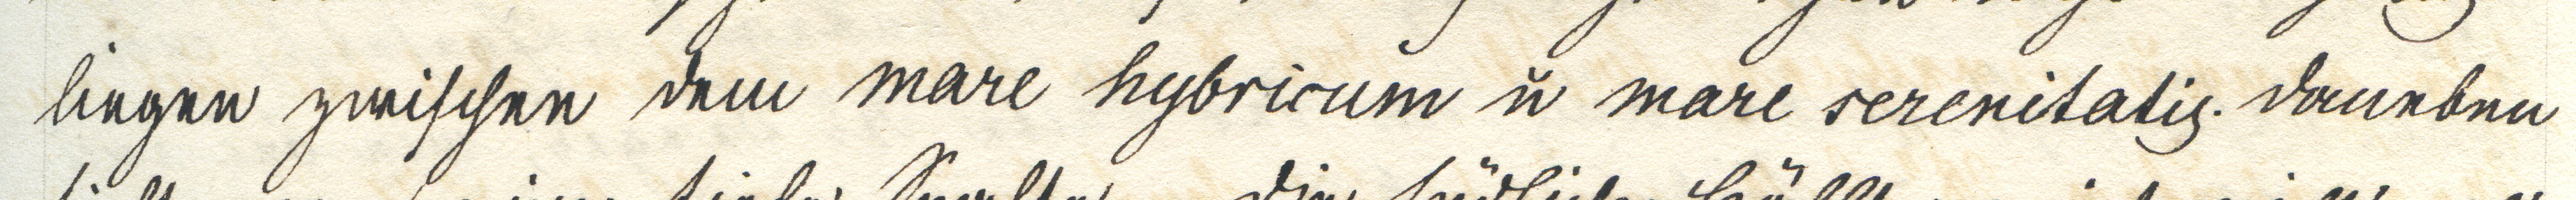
liegen zwischen dem mare hybricum u mare serenitatis. Daneben
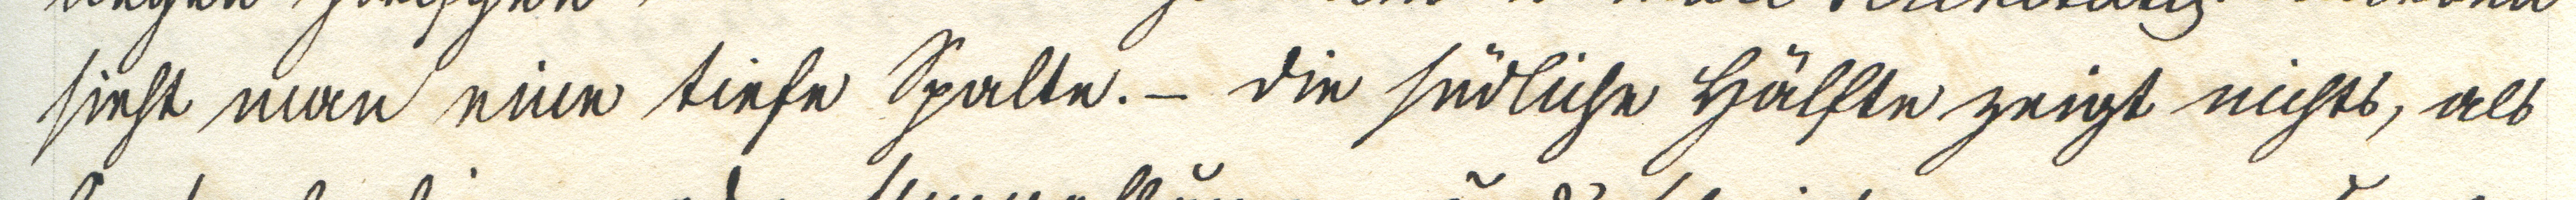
sieht man eine tiefe Spalte. – Die südliche Hälfte zeigt nichts, als
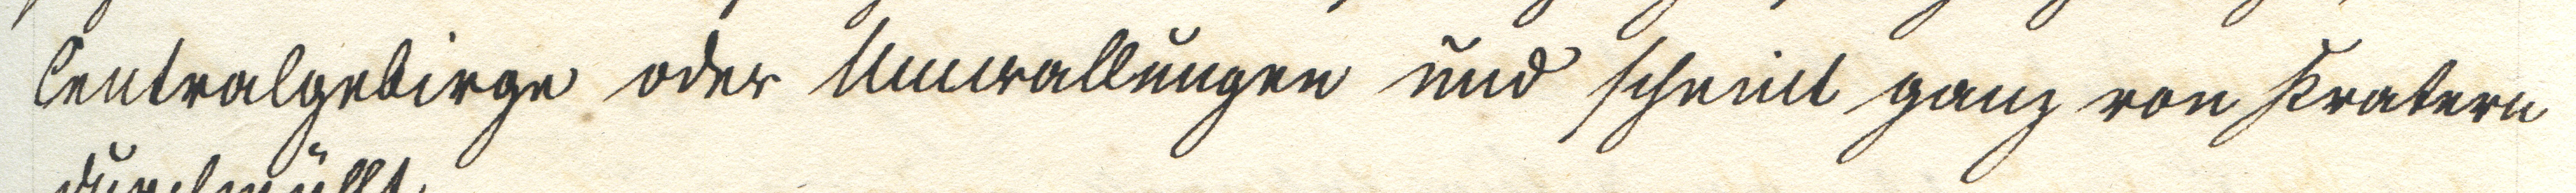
Centralgebirge oder Umwallungen und scheint ganz von Kratern
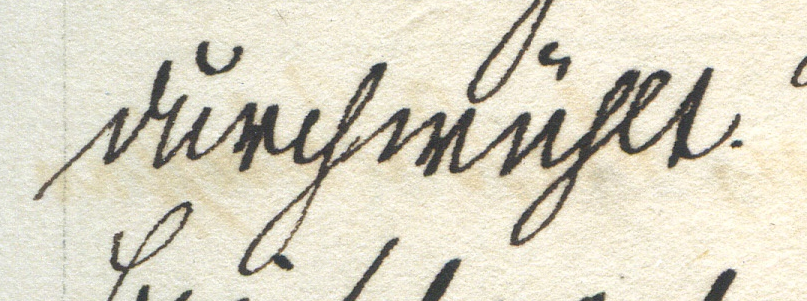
durchwühlt.
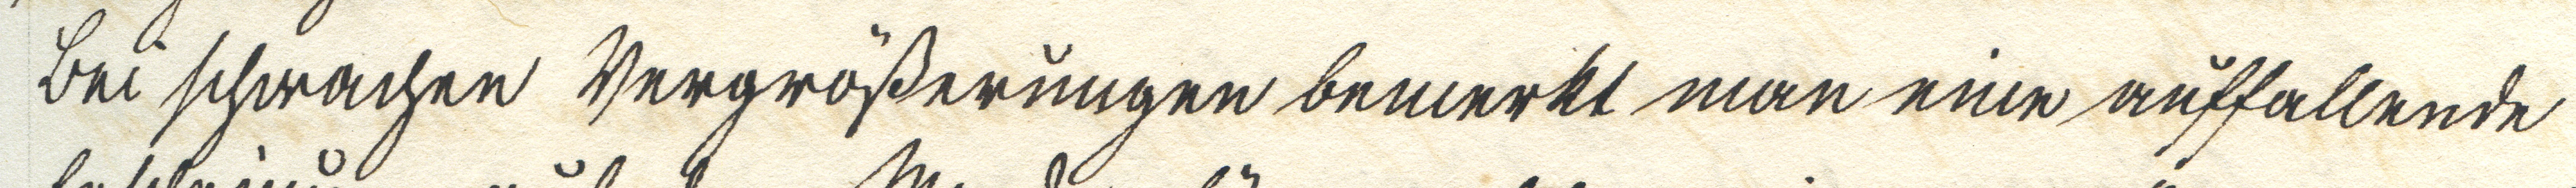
Bei schwachen Vergrößerungen bemerkt man eine auffallende
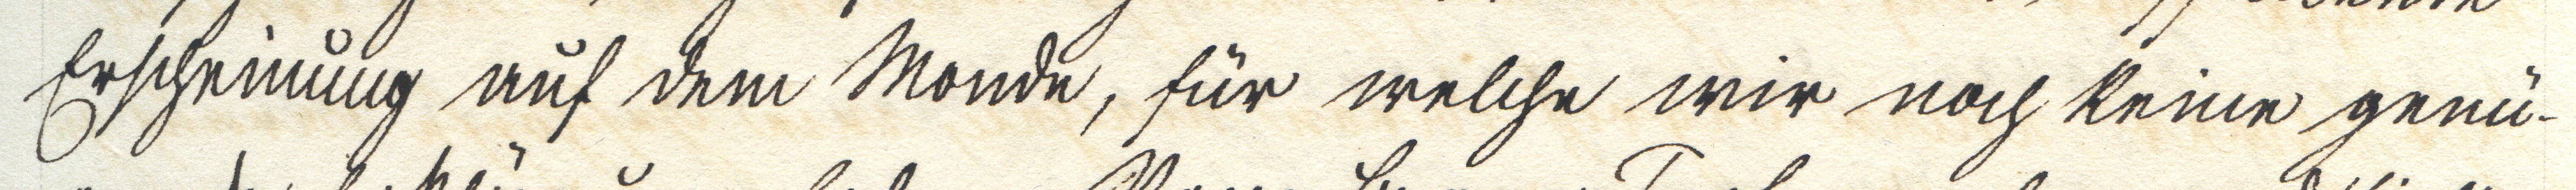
Erscheinung auf dem Monde, für welche wir noch keine genü-
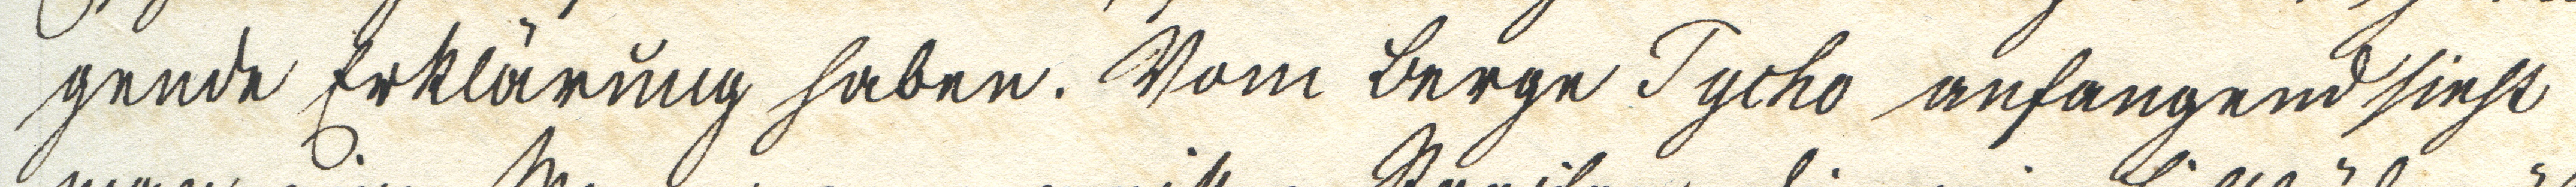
gende Erklärung haben. Vom Berge Tycho anfangend sieht
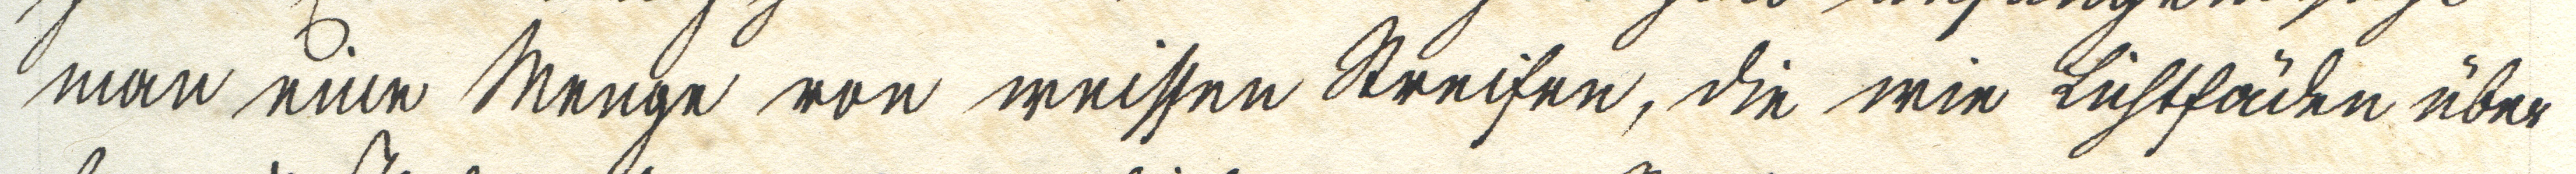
man eine Menge von weissen Streifen, die wie Lichtfäden über
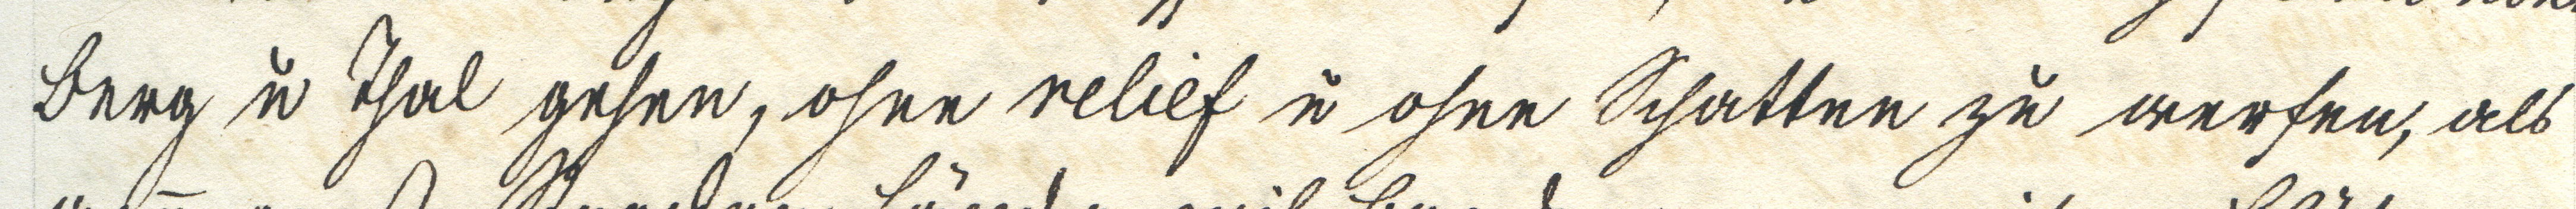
Berg u Thal gehen, ohne relief u ohne Schatten zu werfen, als
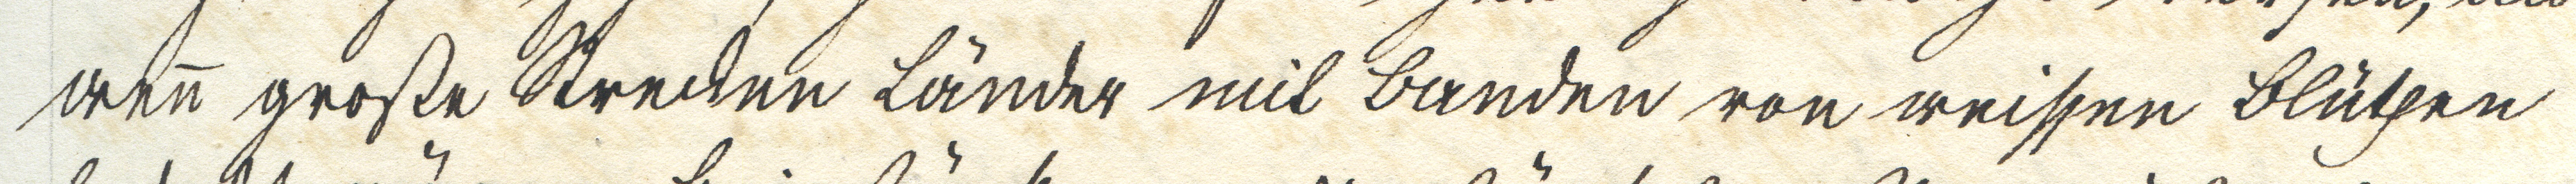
weñ große Strecken Länder mit Banden von weissen Blüthen
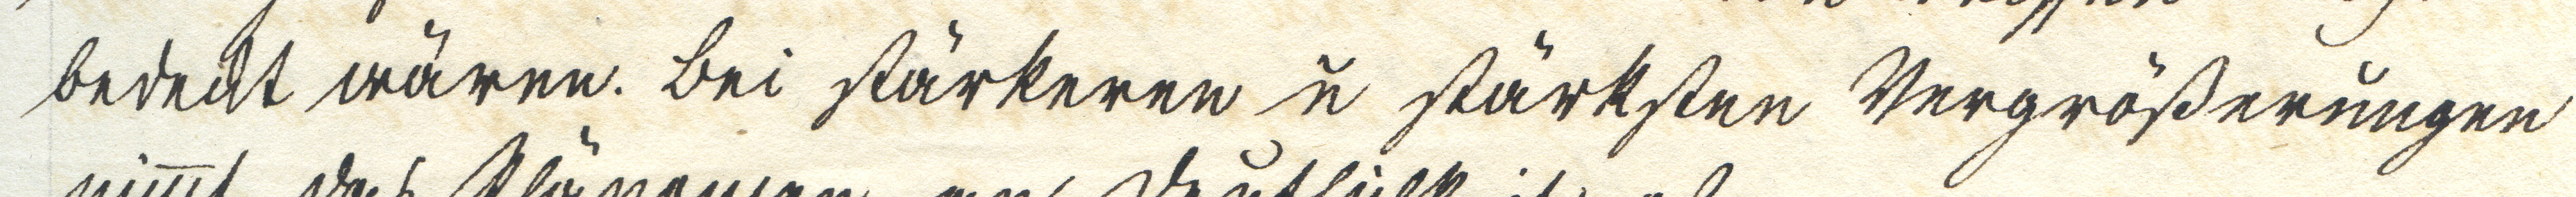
bedeckt wären. Bei stärkeren u stärksten Vergrößerungen
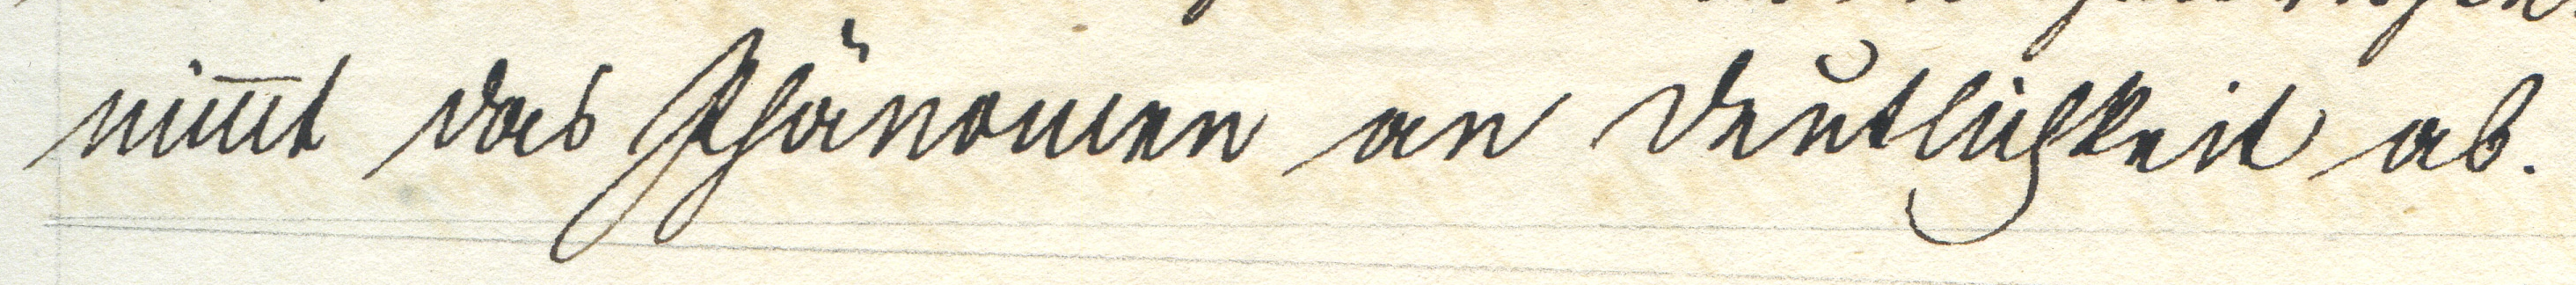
nim̃t das Phänomen an Deutlichkeit ab.
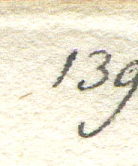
1783
